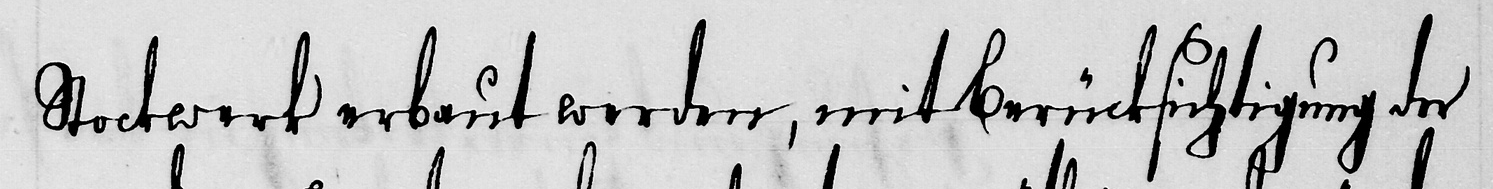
Stockwerk erbaut werden, mit Berücksichtigung der
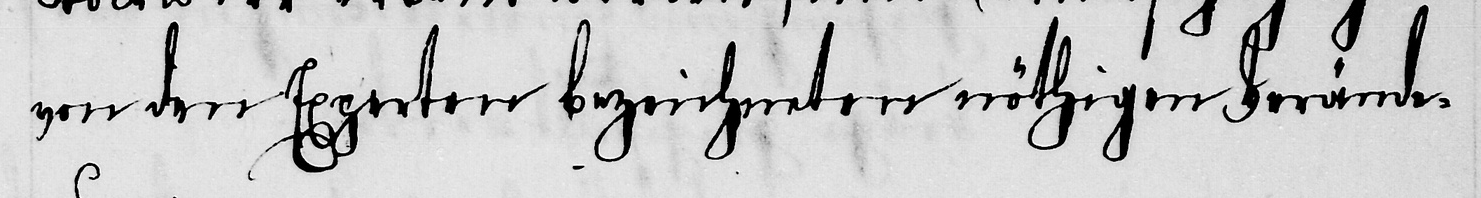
von den Experten bezeichneten nöthigen Verände¬
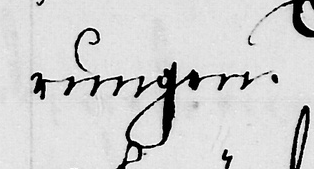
rungen.
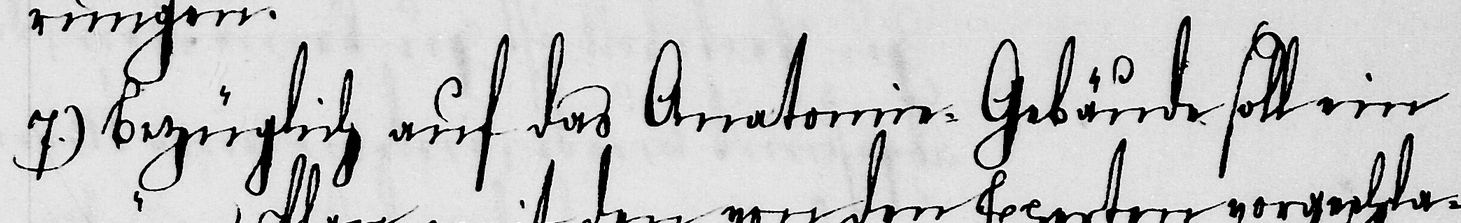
7.) Bezüglich auf das Anatomie-Gebäude soll ein
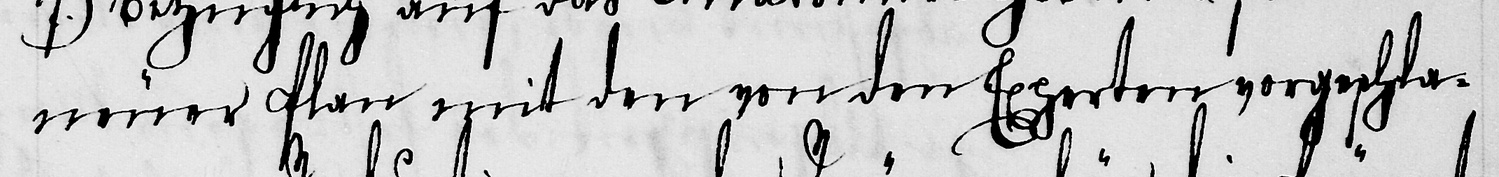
neuer Plan mit den von den Experten vorgeschla¬
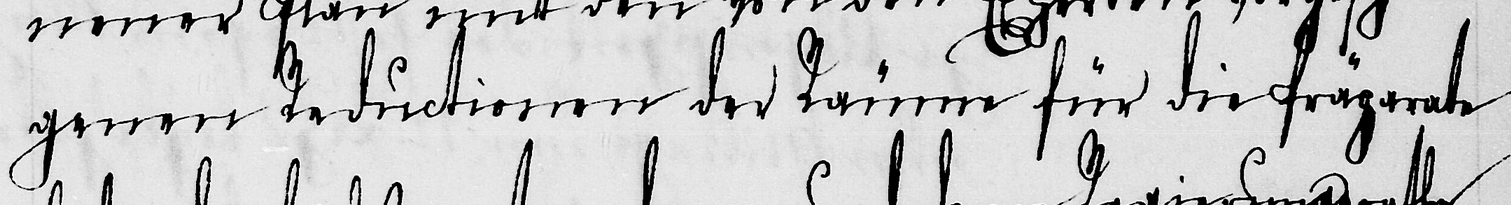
genen Reductionen der Räume für die Präparate
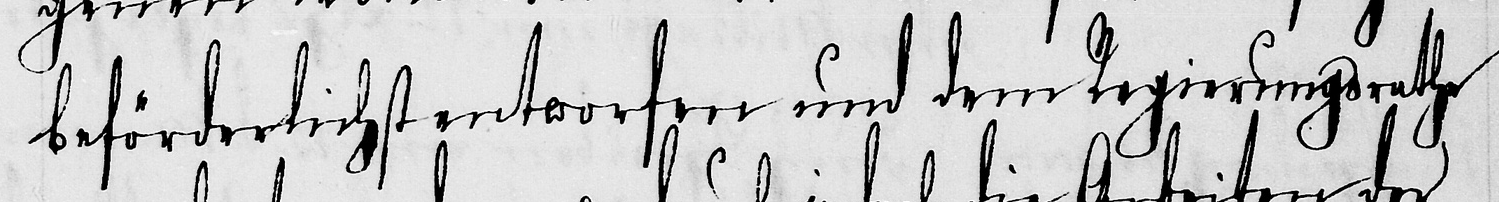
beförderlichst entworfen und dem Regierungsrathe
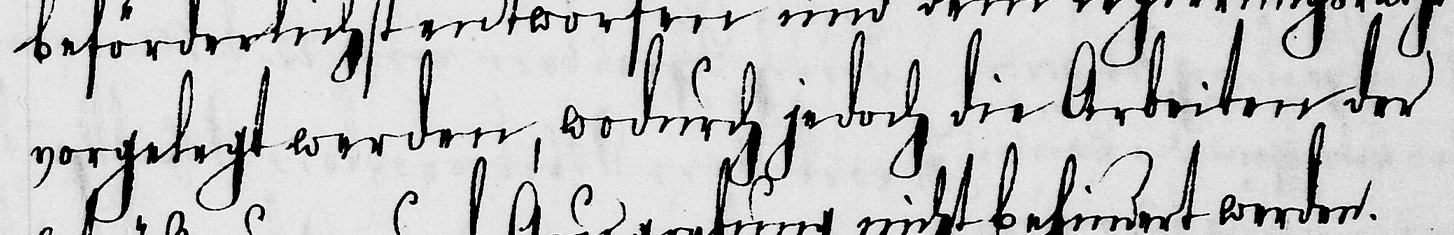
vorgelegt werden, wodurch jedoch die Arbeiten der
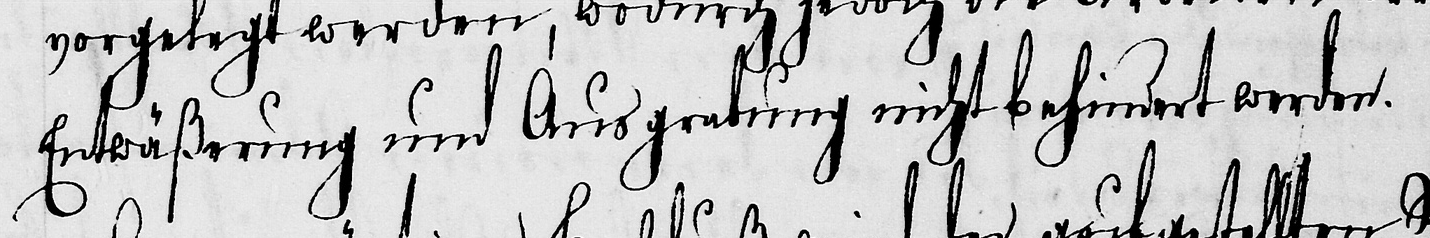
Entwäßerung und Ausgrabung nicht behindert werden.
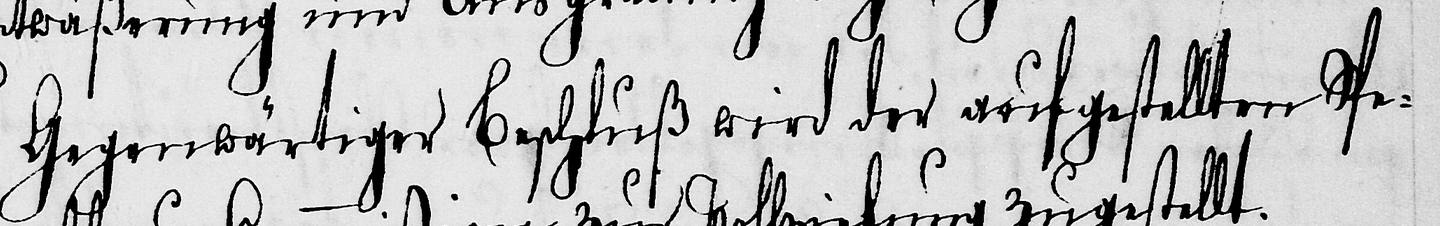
Gegenwärtiger Beschluß wird der aufgestellten Spe¬
